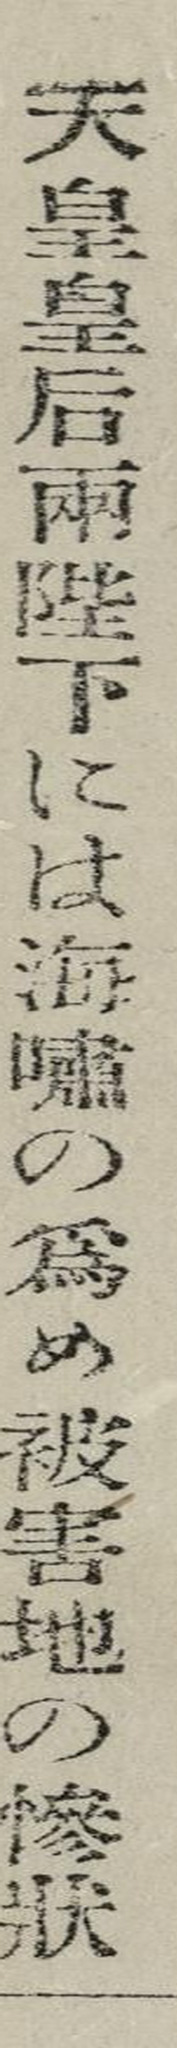天皇皇后両陛下には海嘯の為め被害地の惨状
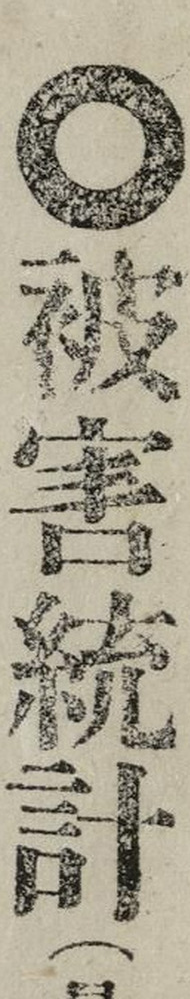○被害統計
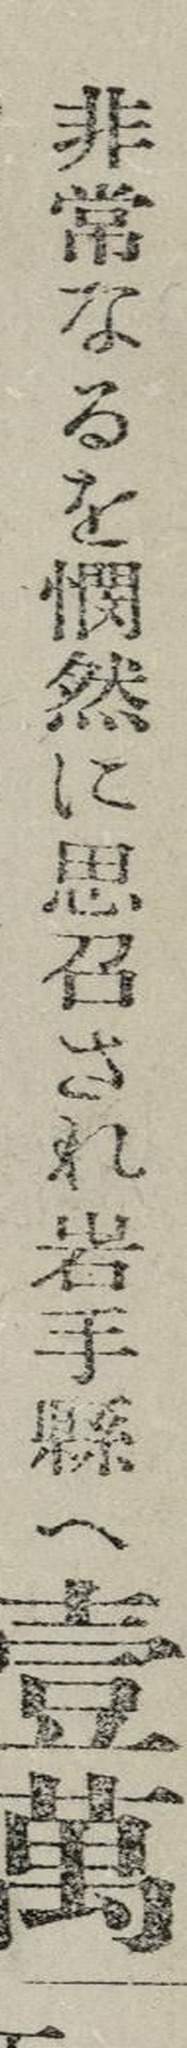非常なるを憫然に思召され岩手県へ壱萬
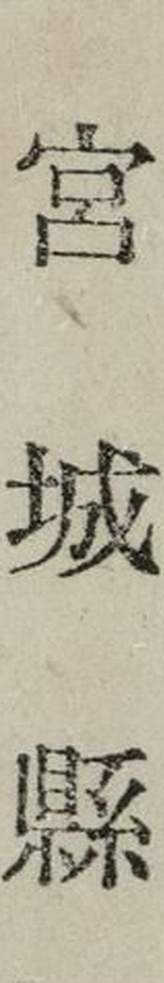宮城県
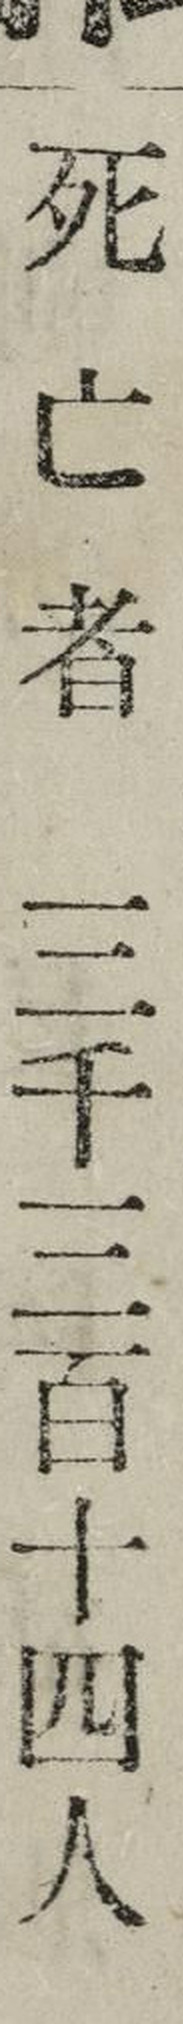死亡者三千三百十四人
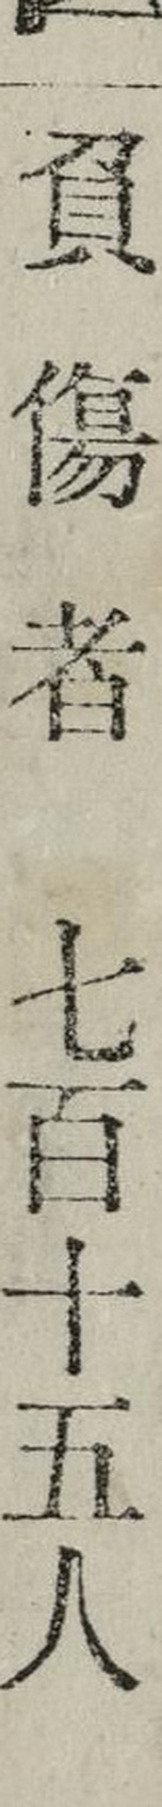負傷者七百十五人
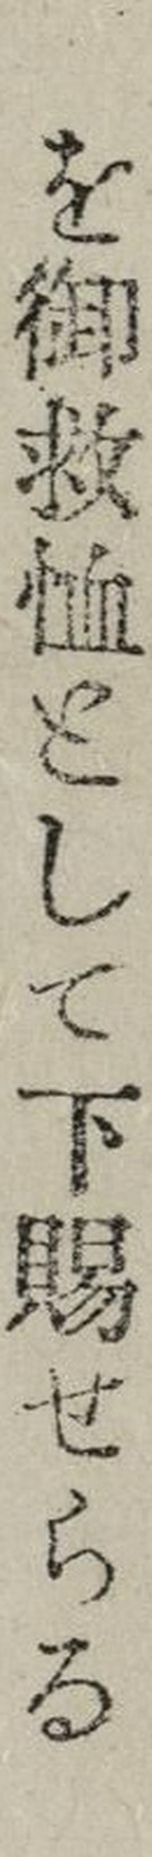を御救恤として下賜せらる
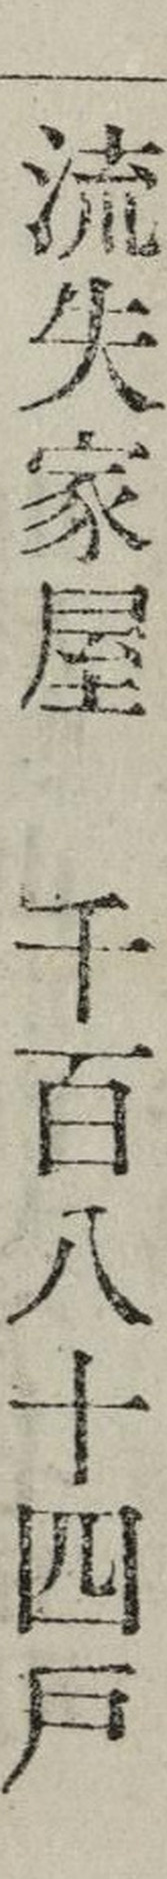流失家屋千百八十四戸
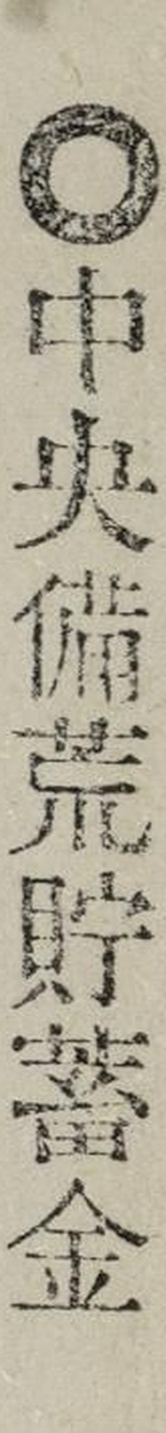○中央備荒貯蓄金
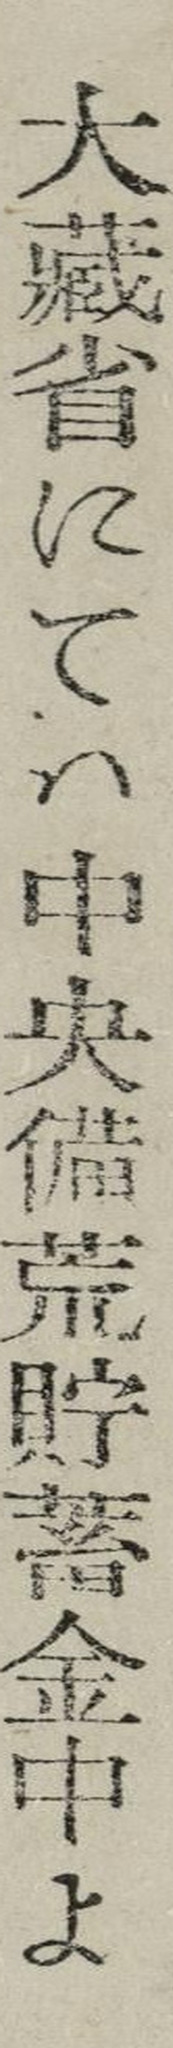大蔵省にては中央備荒貯蓄金中よ
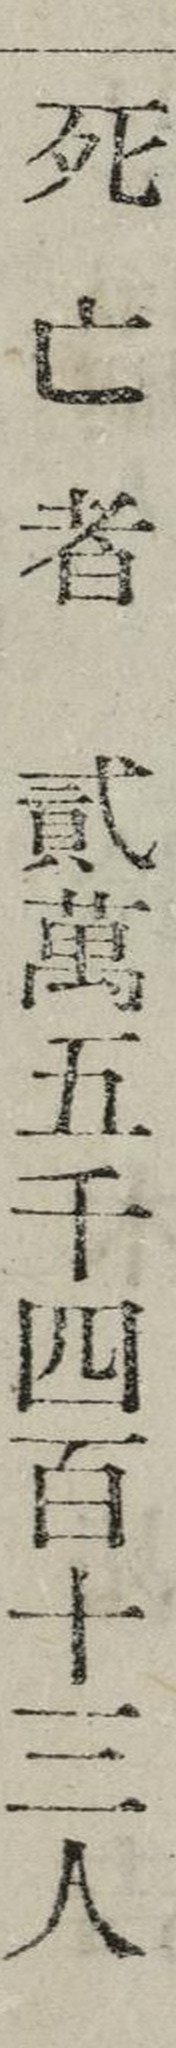死亡者弐萬五千四百十三人
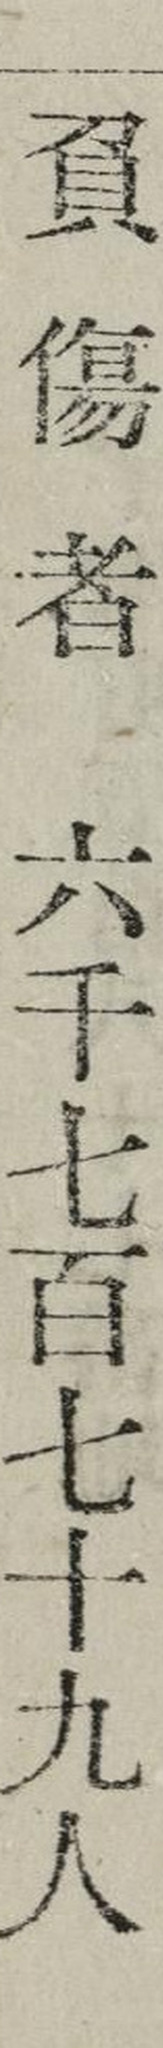負傷者六千七百那十九人
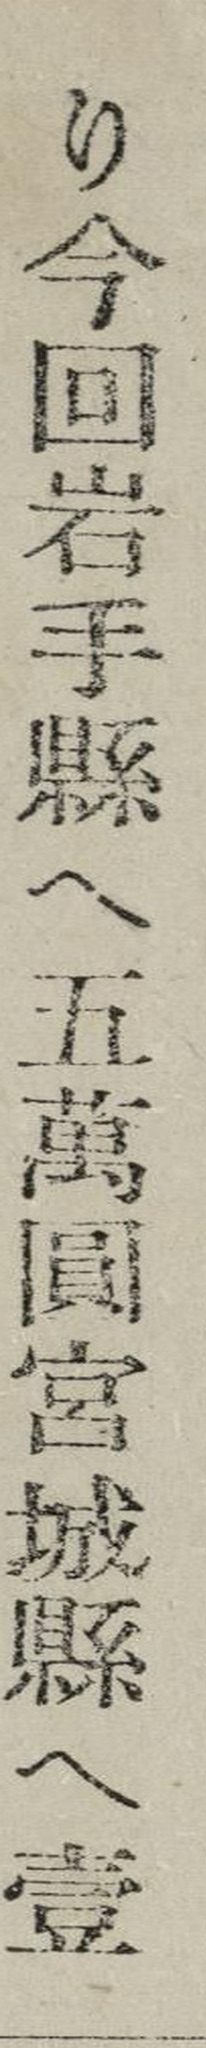り今回岩手県へ五萬圓宮城県へ壱
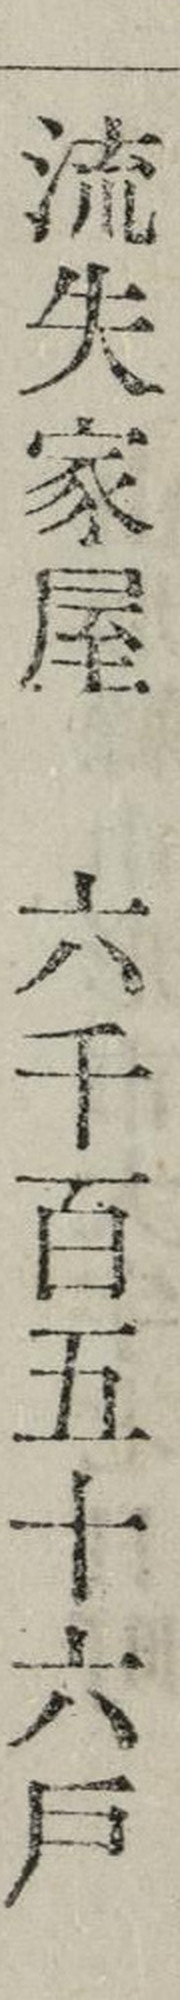流失家屋六千百五十六戸
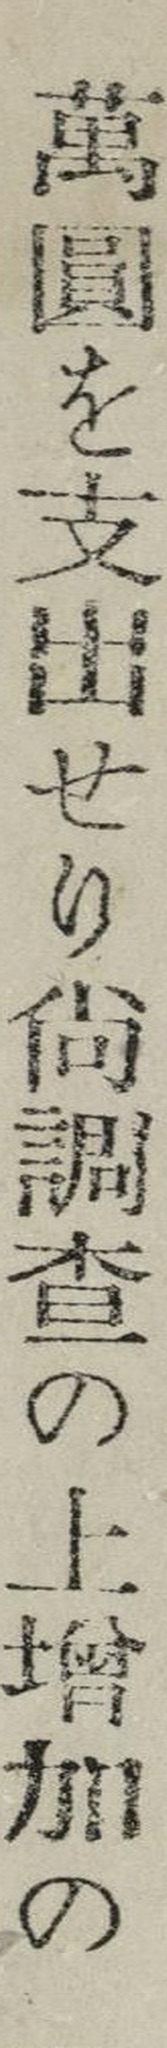萬圓を支出せり尚調査の上増加の
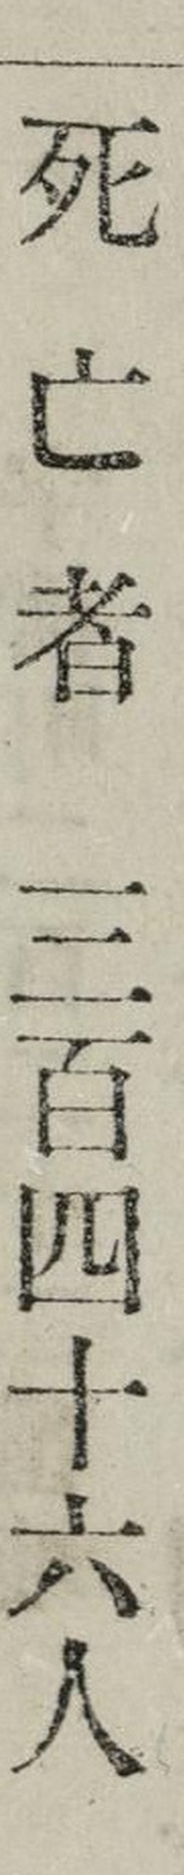死亡者三百四十六人
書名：三陸海嘯細見
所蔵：東京大学地震研究所図書室 Earthquake Research Institute Library, The University of Tokyo, JAPAN
